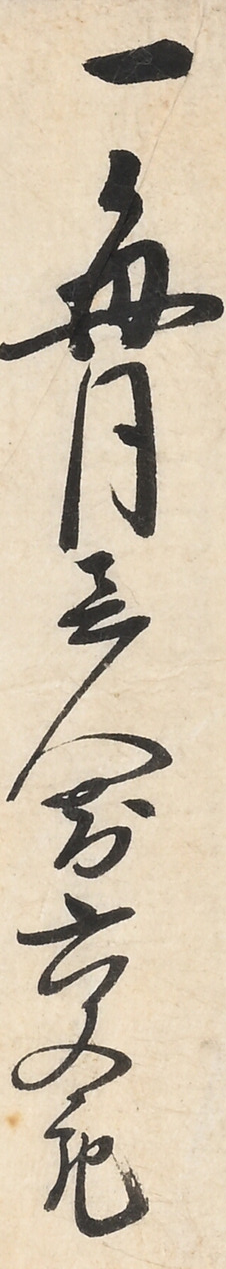一毎月壱人分六文宛
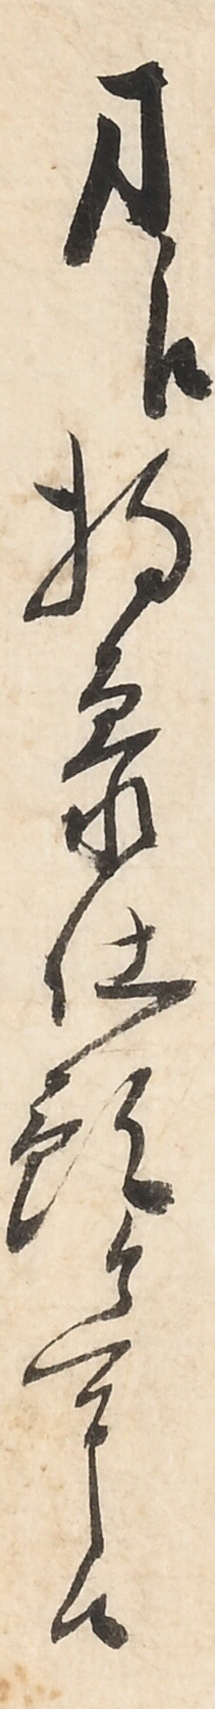方江持参仕預ヶ可申候
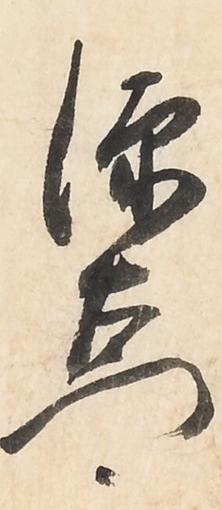源右衛門
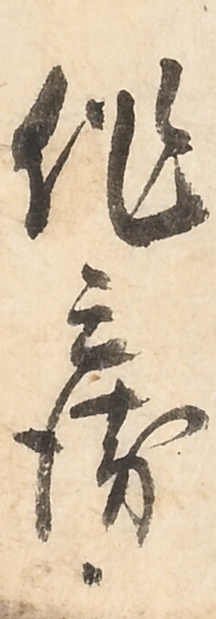作兵衛
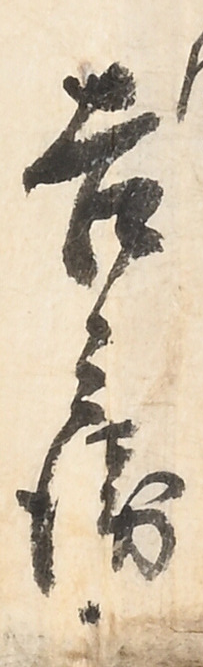吉兵衛
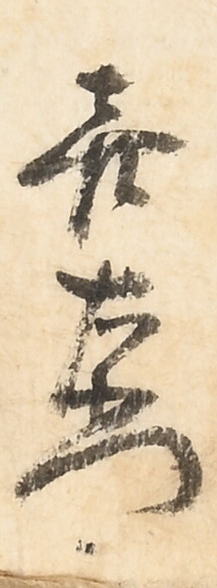喜右衛門
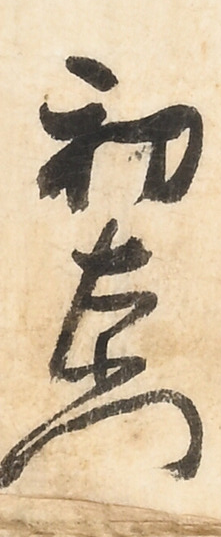源右衛門
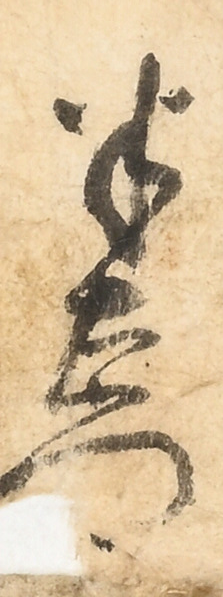半右衛門

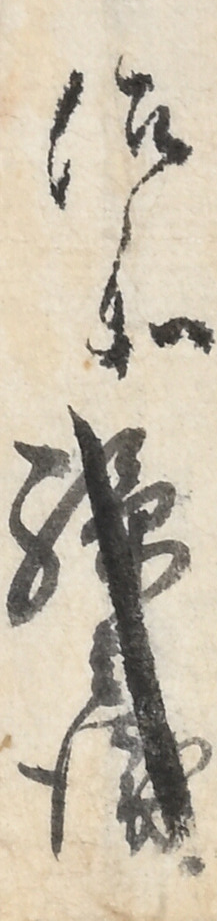佐兵衛
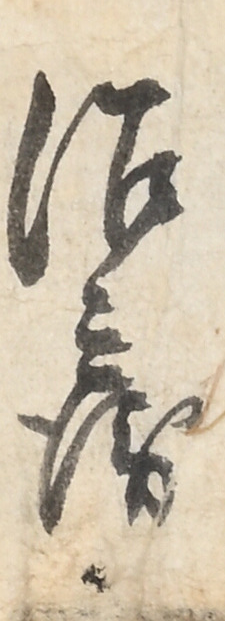佐兵衛
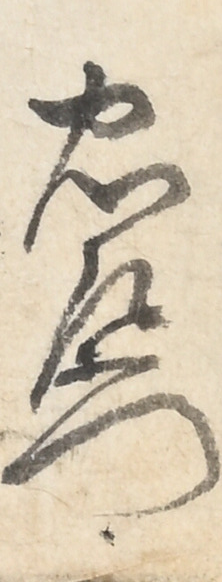忠左衛門
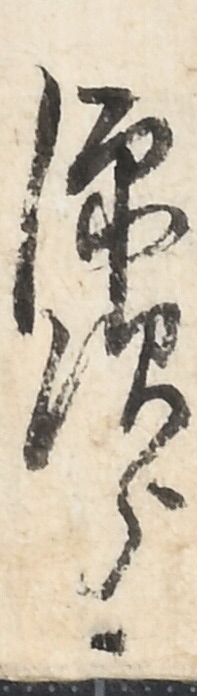源次郎

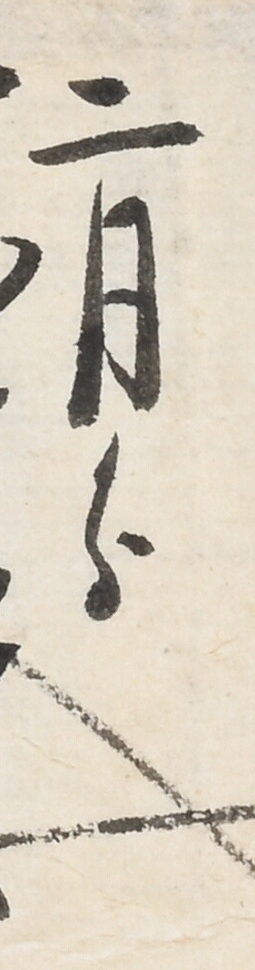二月分
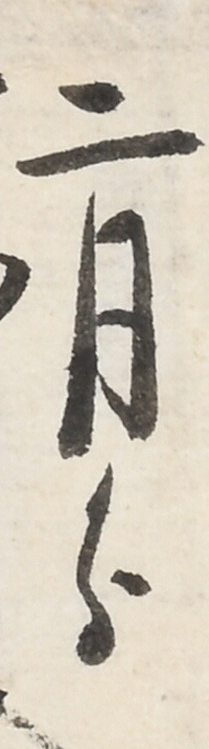二月分
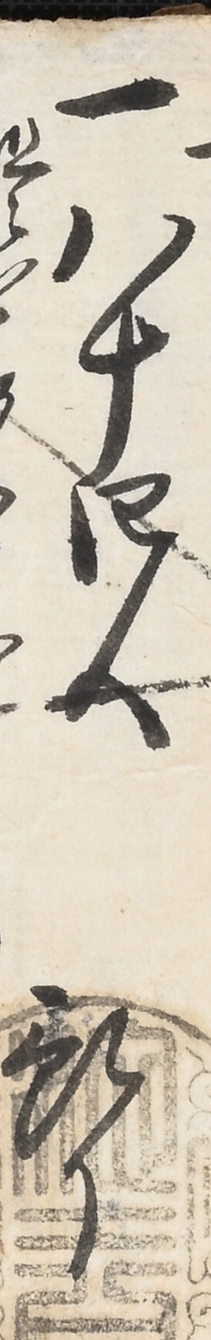一八十四文預り㊞
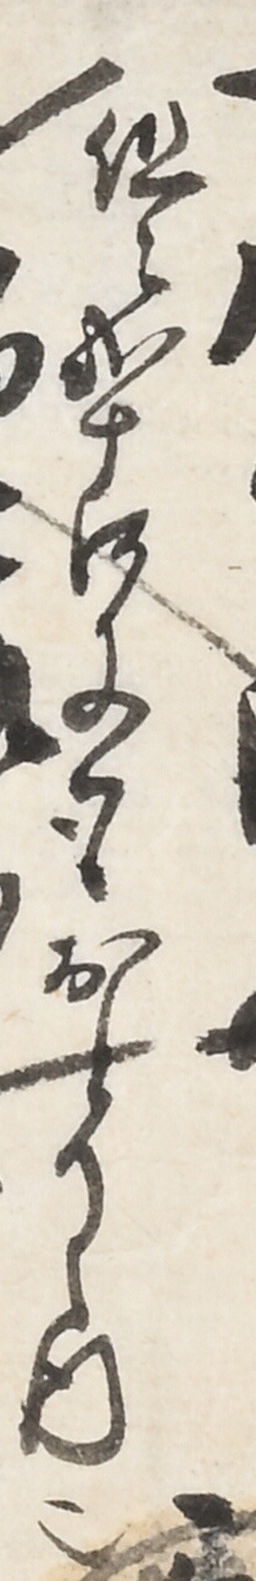但し弐十四文もおり之内也
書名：覚
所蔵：伊那市立高遠町図書館・合同会社AMANE
